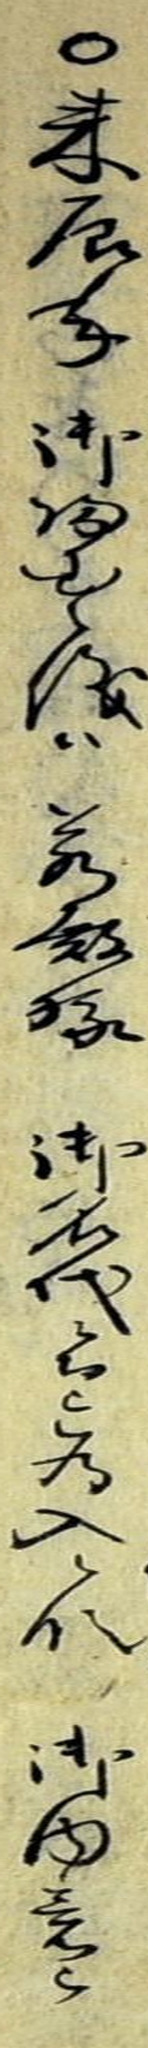〇来辰年御帰国之儀ハ若殿様御名代ニ而被為入候段御内意被
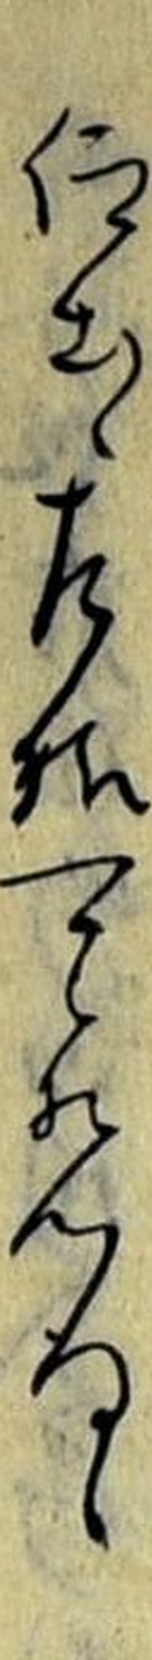仰出候左様可被相心得候

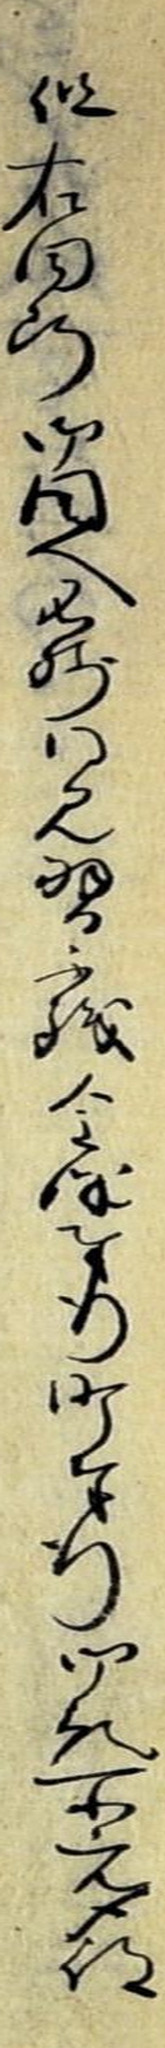但右同断御用人不残同見習不残金津奉行町奉行御預所元〆役
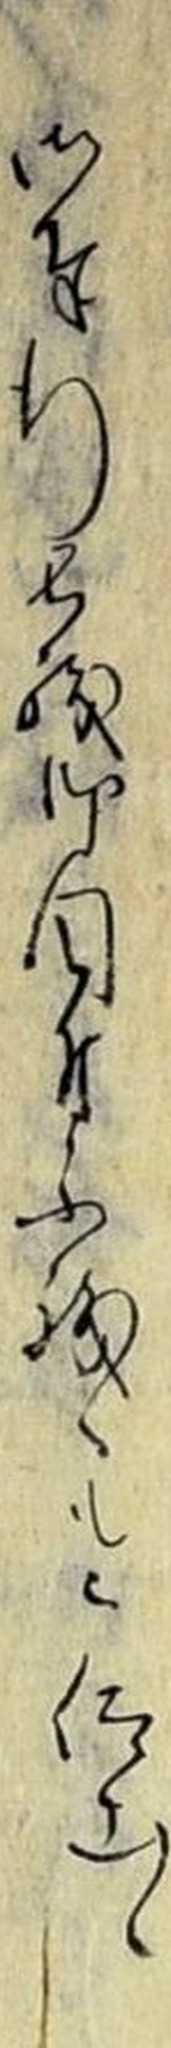御奉行不残御目付不残へも被仰出候
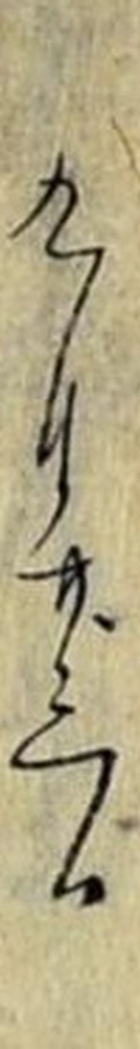九月廿三日
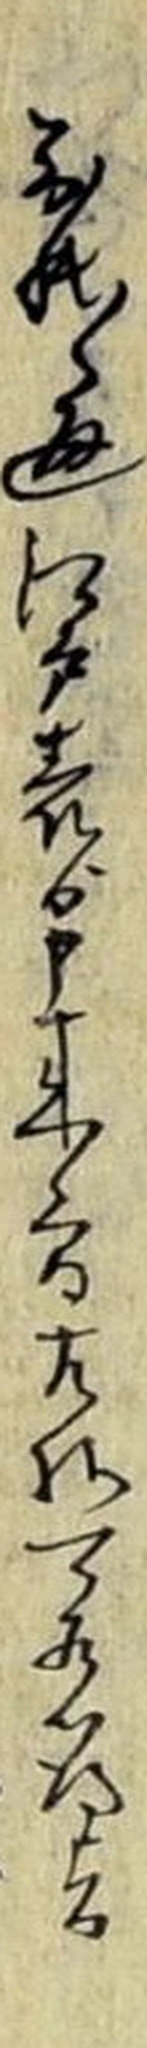別紙之通江戸表ゟ申来候間左様可相心得旨
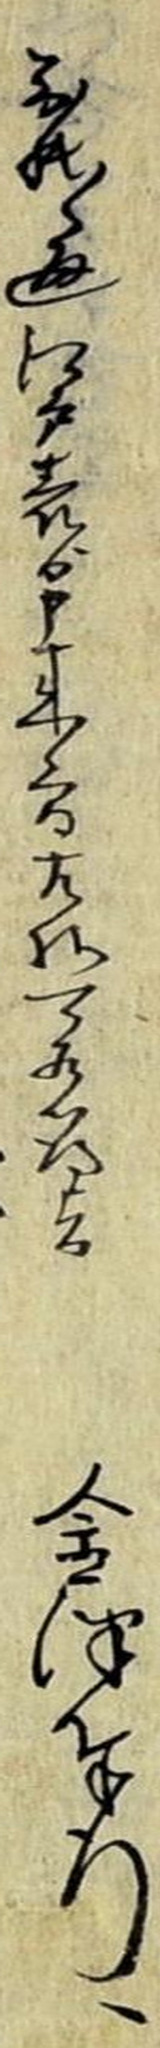別紙之通江戸表ゟ申来候間左様可相心得旨
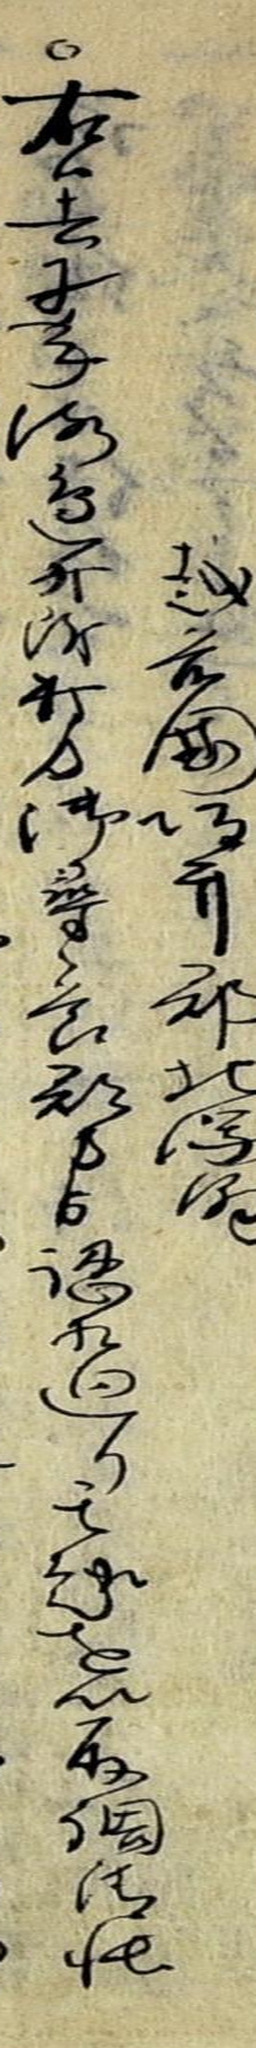〇右ハ去寅年海辺村付村方御尋之節郡方ゟ認相廻り其趣を以取調御帳
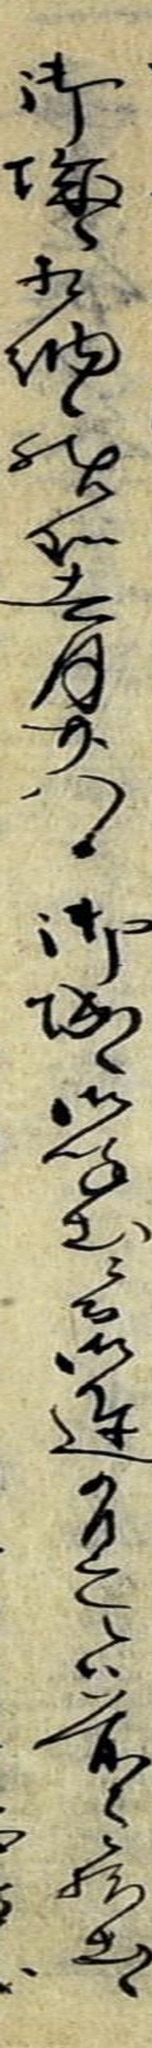御城へ相納候然ル処去月廿八日御城へ御呼出ニ而御達有之候ハ前々指出候
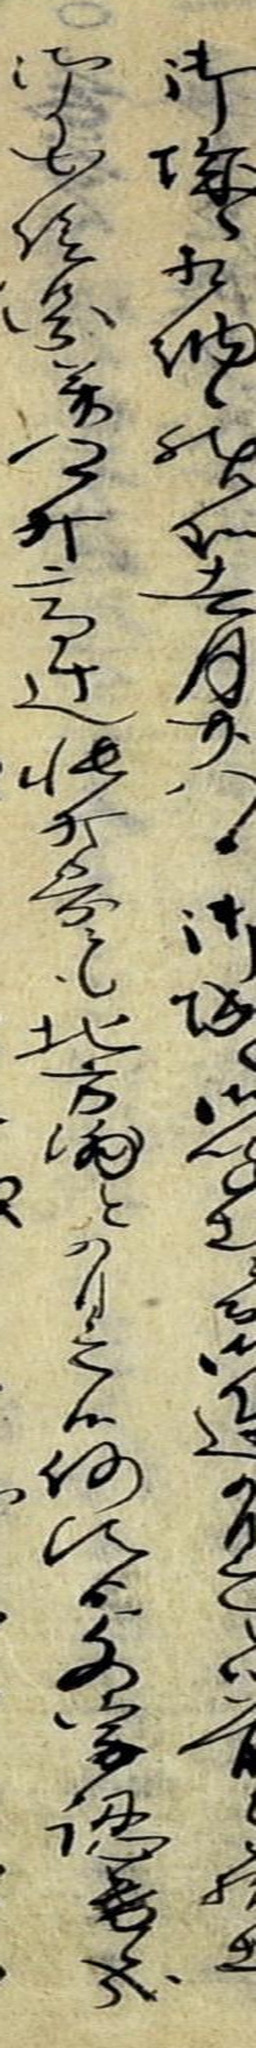御国絵図并郷村高辻帳村寄ニも北方浦と有之候何頃ゟ文字認替候哉
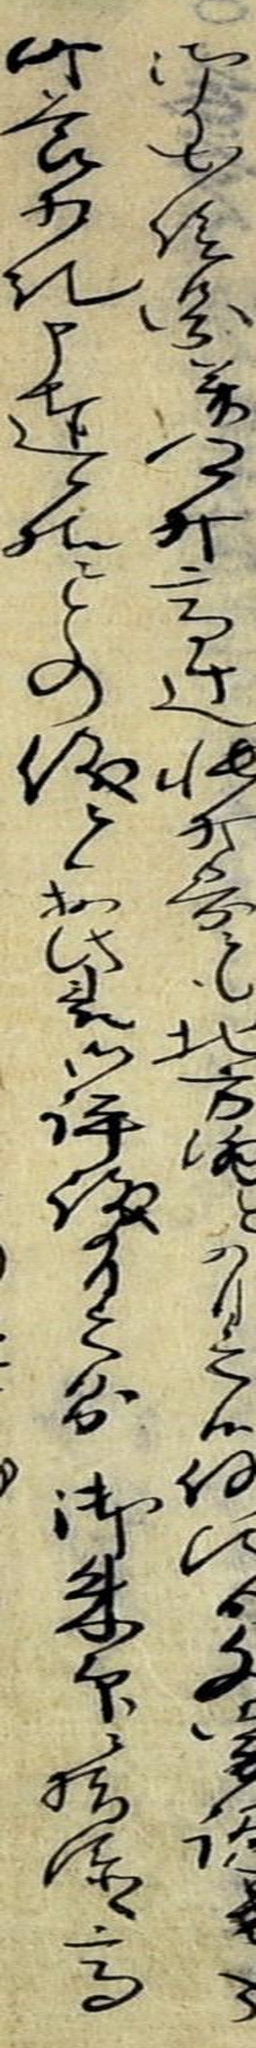御節相糺申達候様ニとの儀ニ候於此表御評議有之則御朱印ニ指添候高
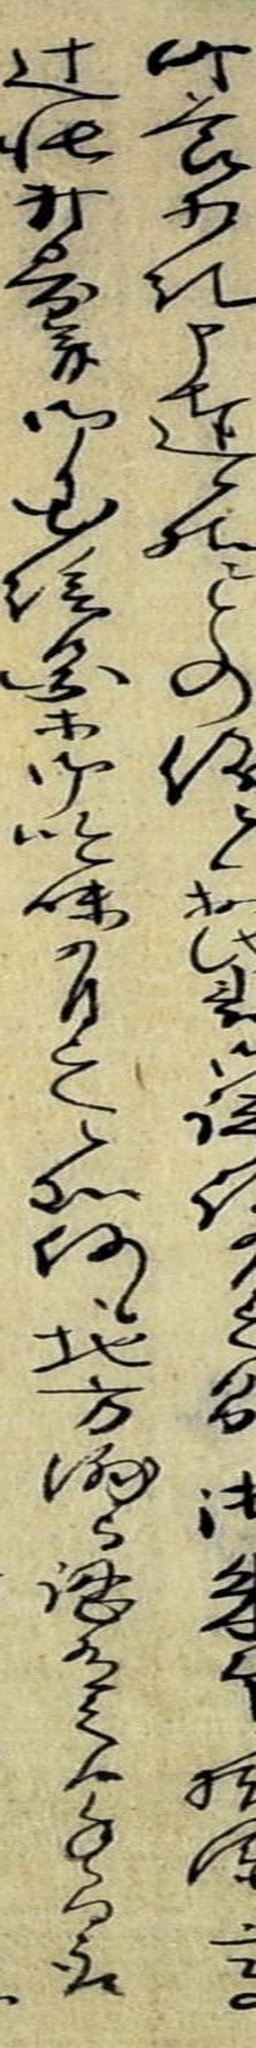辻帳村寄并御国絵図等御吟味有之候処何も北方浦与認有之候手間取
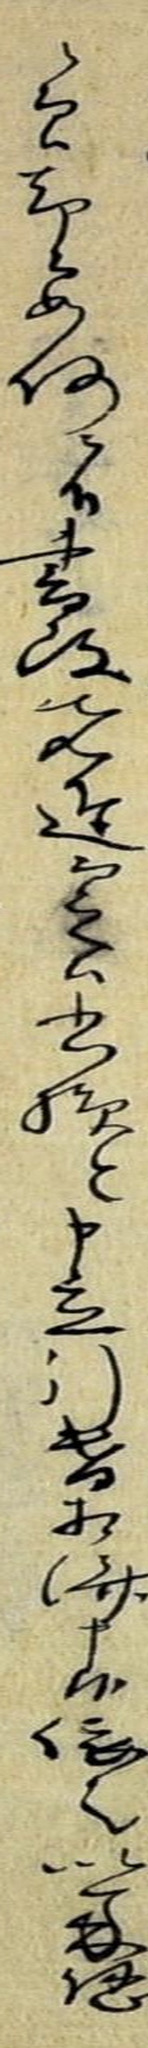候而ハ却而如何ニ候書役先達而之ハ書損と申立引替相済申候依之以来認
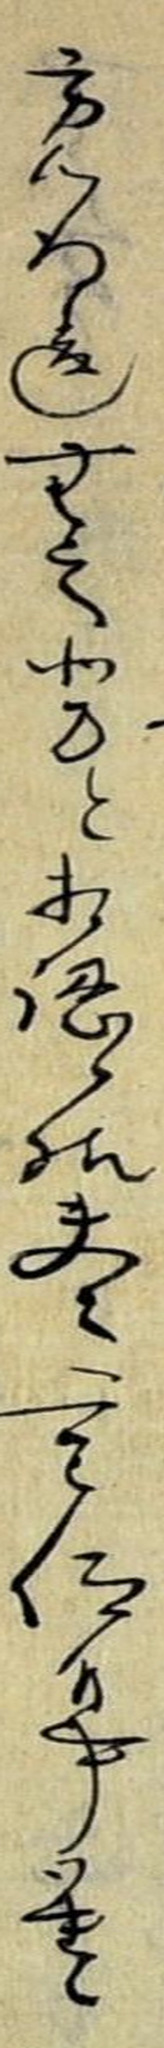方心得違無之北方と相認候様夫々へ可被仰付事御座候
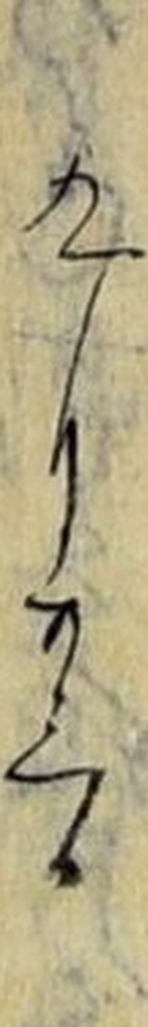九月廿三日
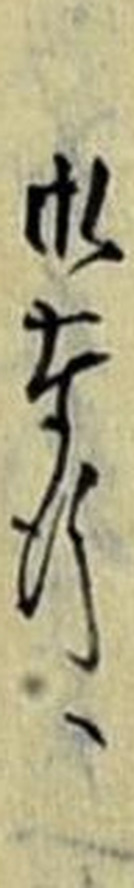御奉行へ
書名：命令之部 三
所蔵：福井県文書館 Fukui Prefectural Archives
